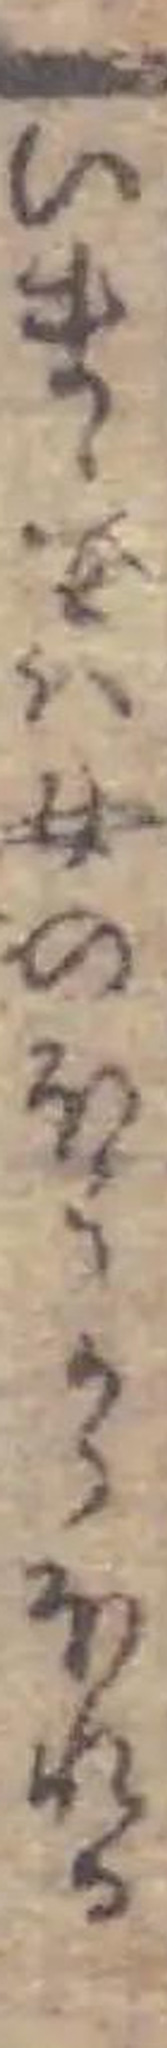いまゝでは女のほうからほれる
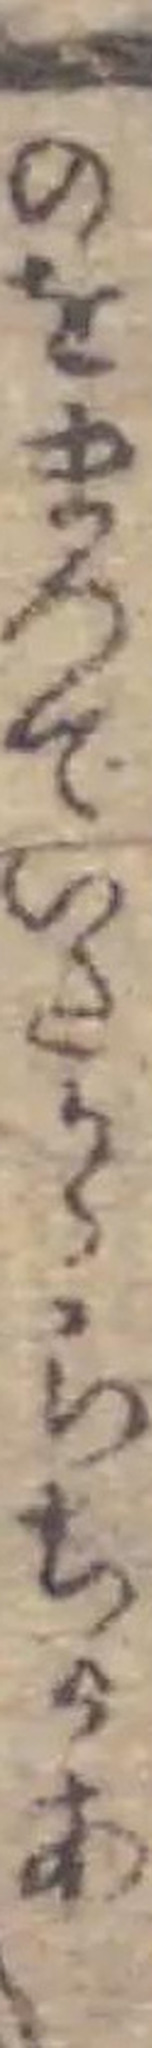のをまつていたかららちがあ
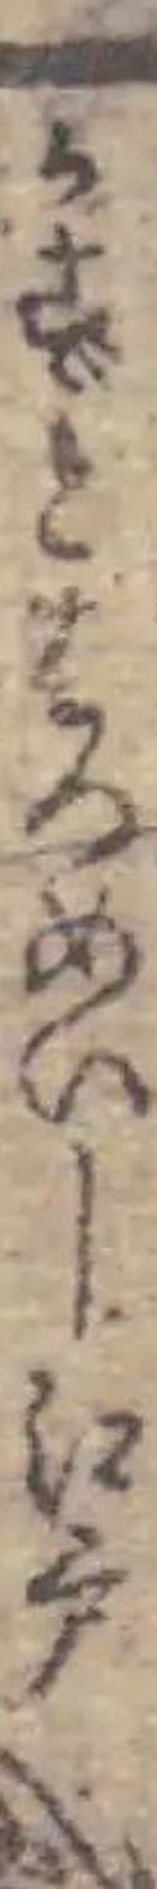かずとはつめいし江戸
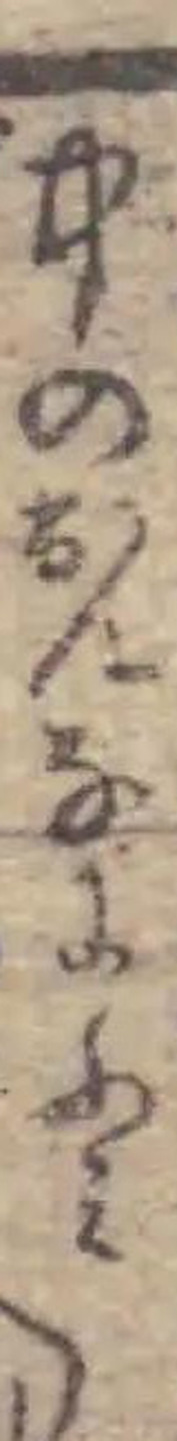中のおんなにふみ
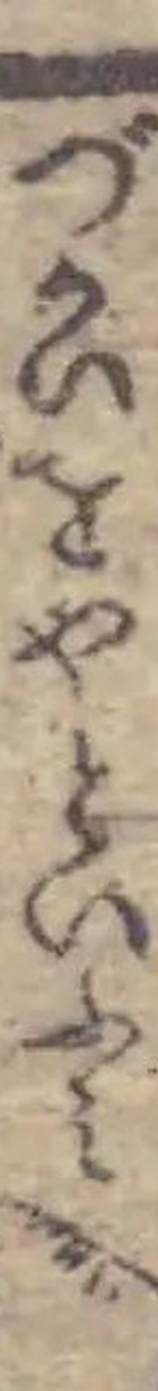づかいをやといふみ
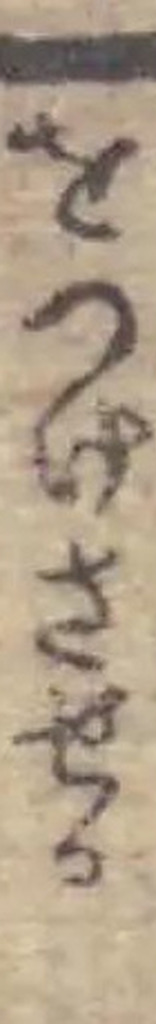をつけさせる
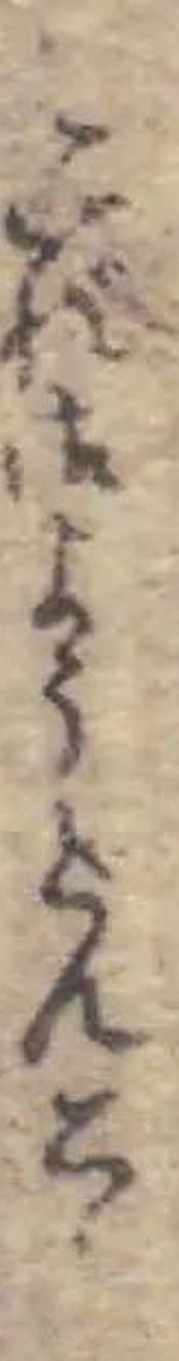これ御ようどんこゝ
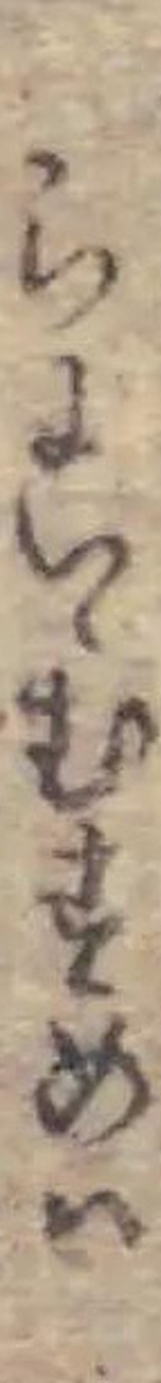らにいゝむすめは
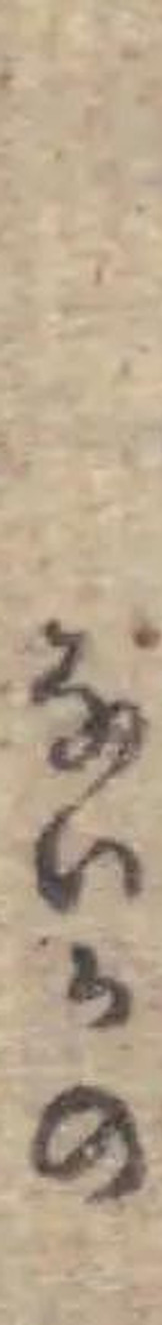ないかの
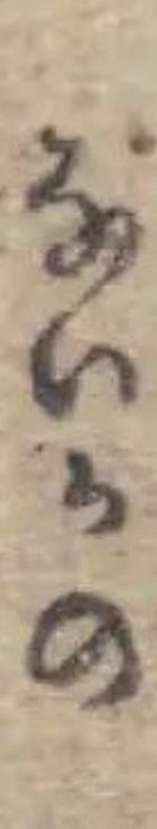ないかの
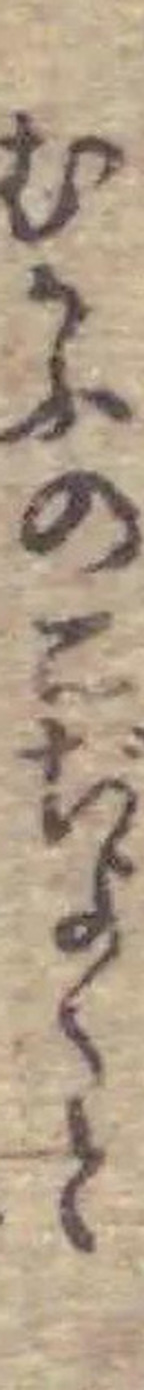むかふのこぢよくと
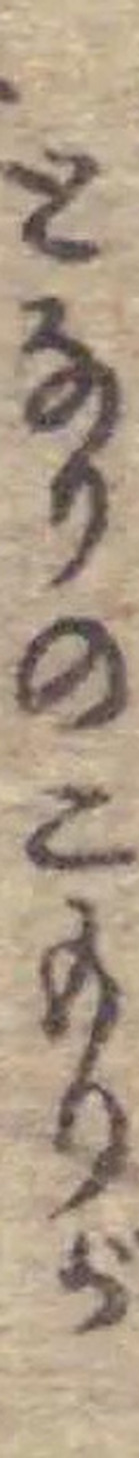となりのこもりが
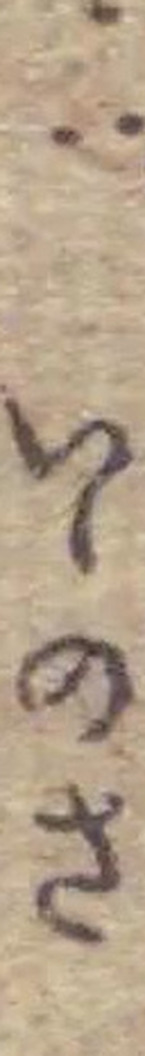いゝのさ
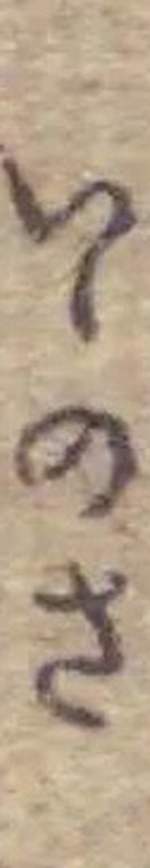いゝのさ
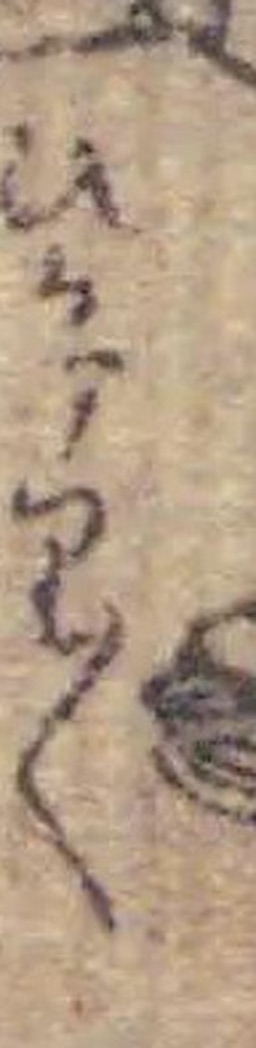ひかアり〳〵
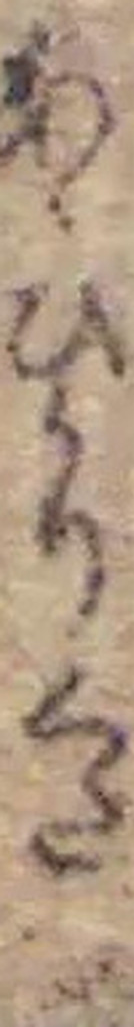あゝひかりくた
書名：色男其処此処 3巻
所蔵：国立国会図書館 National Diet Library, JAPAN
